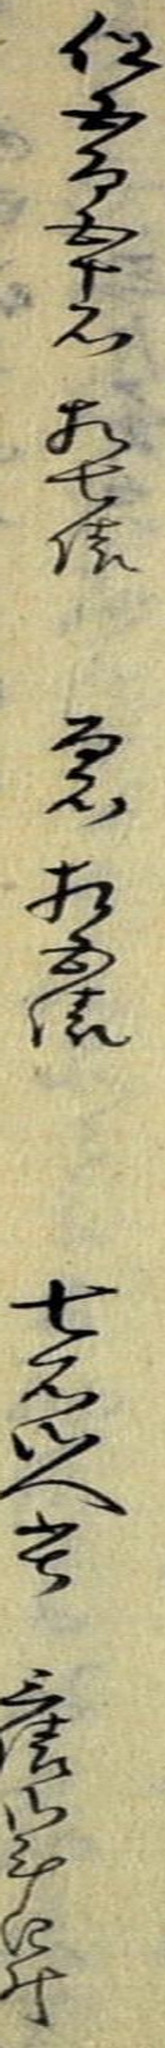但五百五十石拾七俵百石拾五俵七石弐人ふち三俵弐斗四升
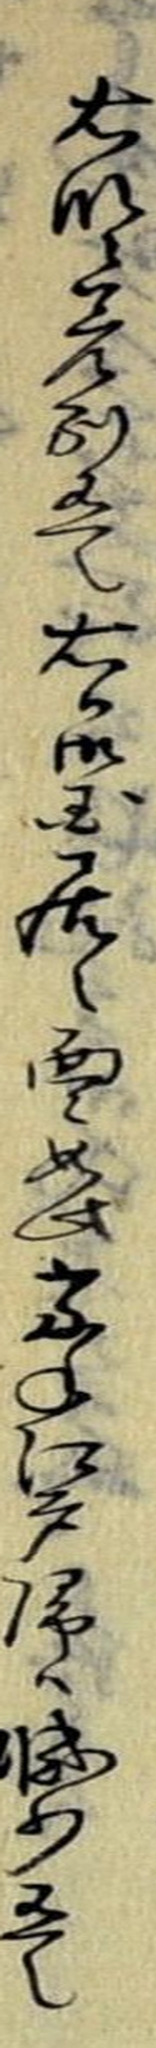右段ニ差別有之右ハ御国居候面々如此当年江戸帰ハ減少有之
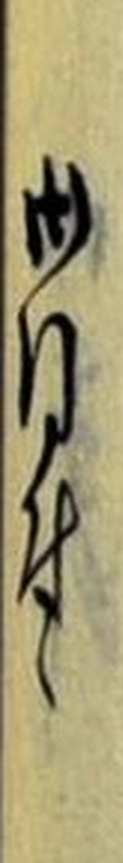御目付へ
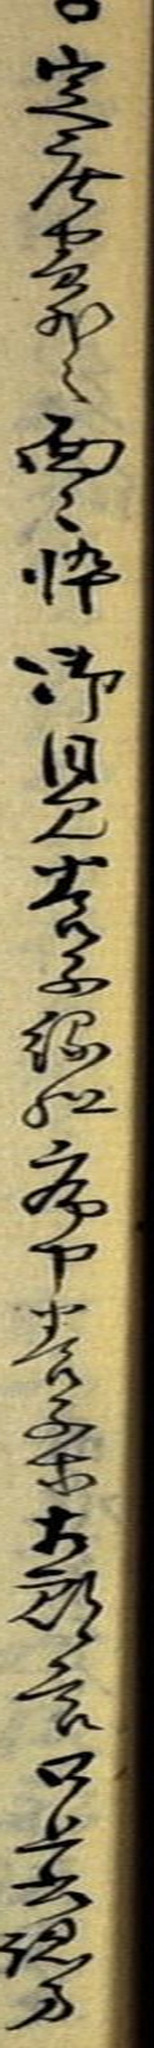〇定府番外之面々忰御目見養子縁組病中養子等相願候節口上書認方
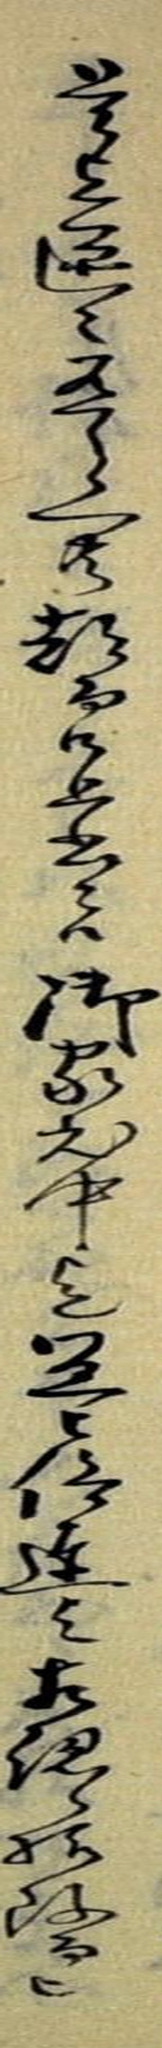是迄区々有之候へ共都而上書ニハ御家老中迄宜被仰達与相認候様改而被
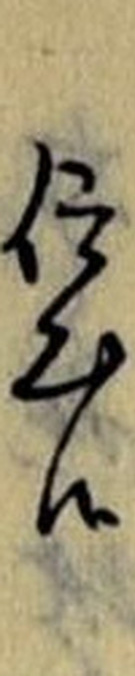仰出候
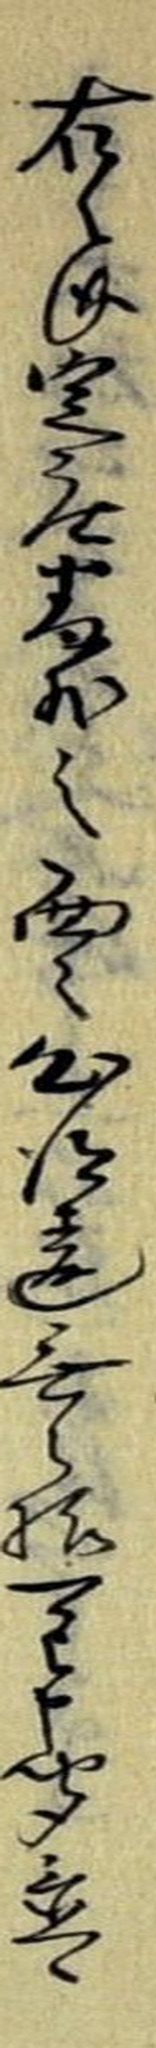右之趣定府番外之面々心得違無之様可被申聞置候
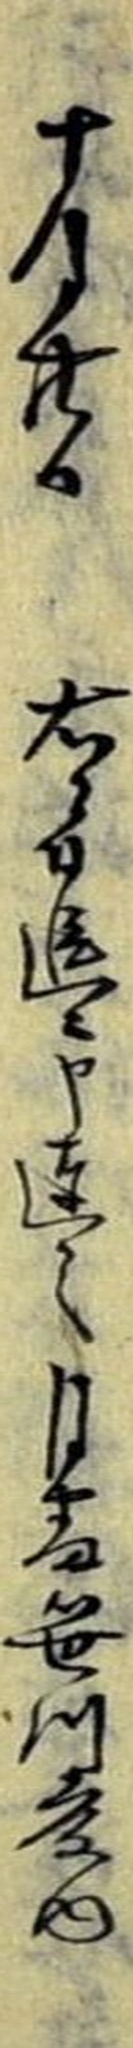十月廿日右ニ付追々申達之月番笹川藤内
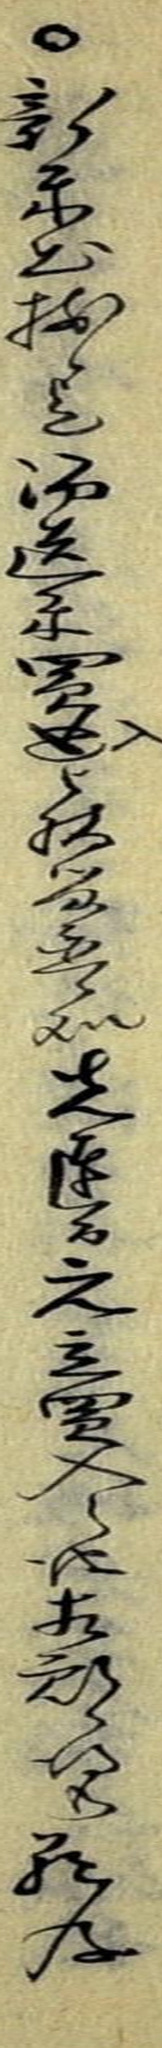〇新米出揃候迄酒造米買込入被指留置候処先達而元立買入之儀相願候得共難及
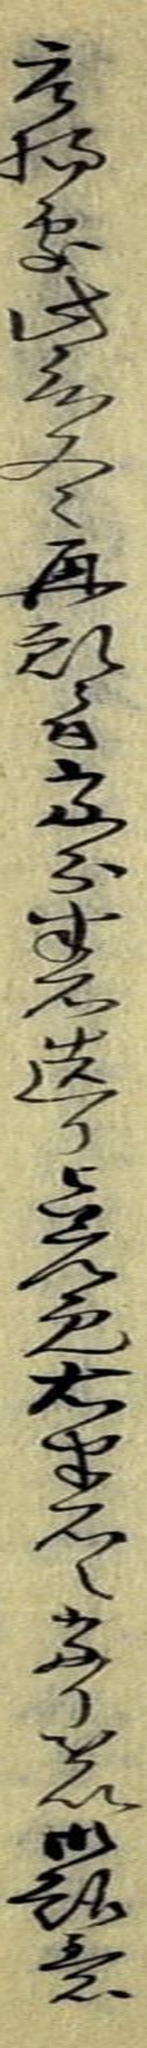取揚候処此度又々再願ニ付当分半石造り被差免右半石之当りを以御趣意
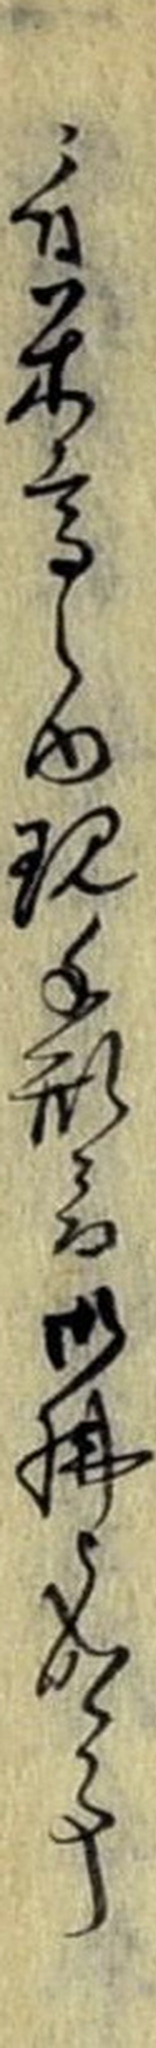ニ付米高之内現手形ニ而御払被成候事
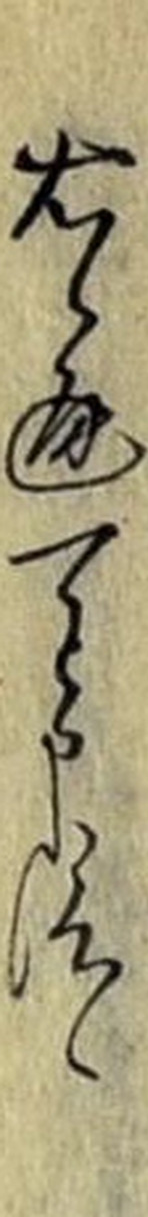右之通可被申渡候
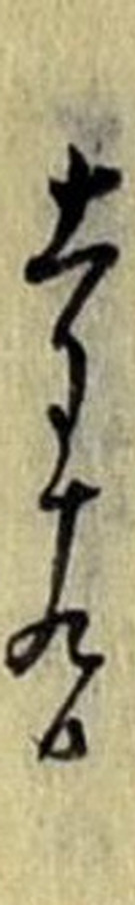十一月十九日
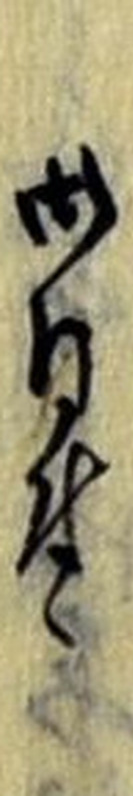御目付へ
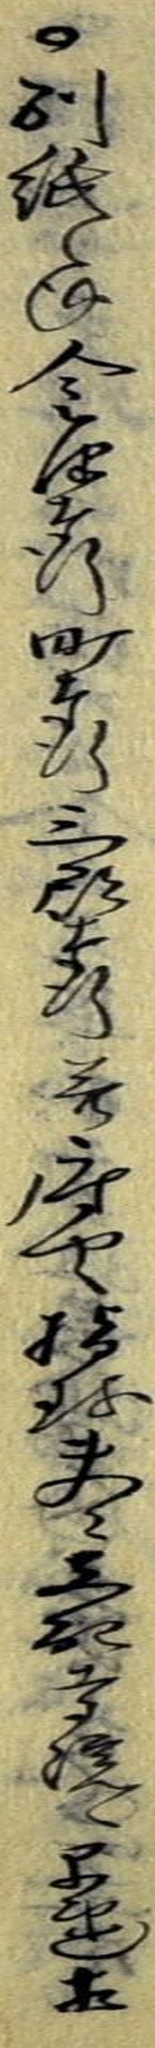〇別紙之趣金津奉行町奉行三郡奉行并府中へ指越夫々支配寺院へ早速相
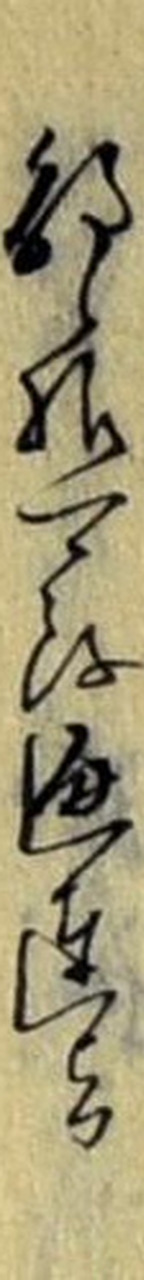触候様可致通達旨
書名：命令之部 五
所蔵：福井県文書館 Fukui Prefectural Archives
